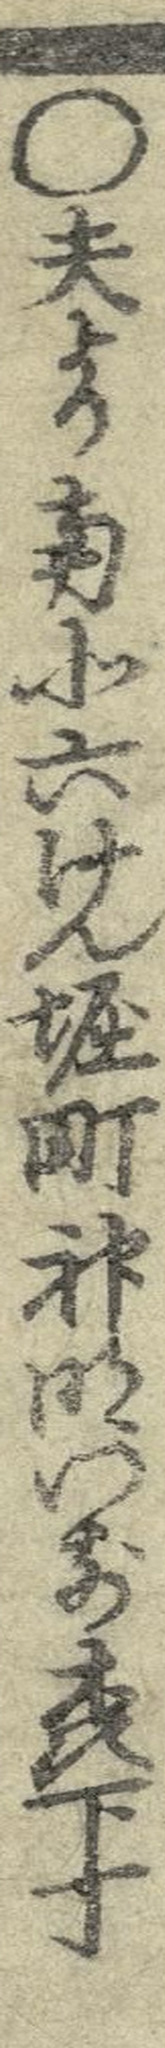〇夫より南北六けん堀町神明門前森下丁

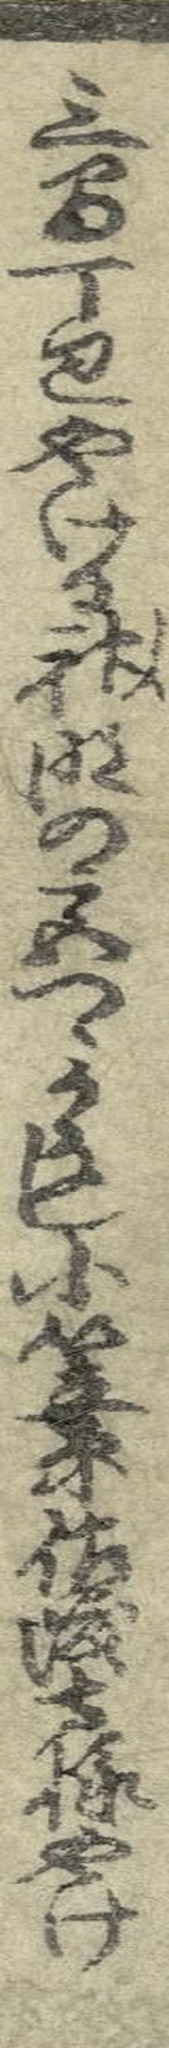三宿丁辺やける神明の宮つつかなし小笠原佐渡守様やけ
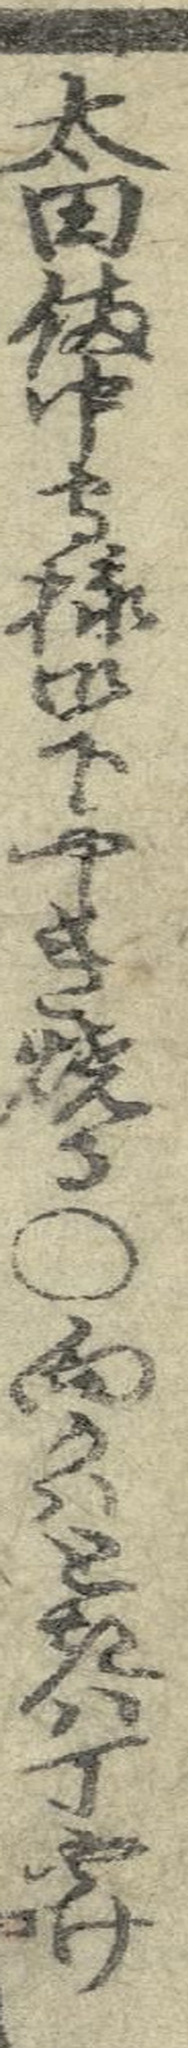太田備中守様御下ゆき焼る○向かハときハ丁やけ
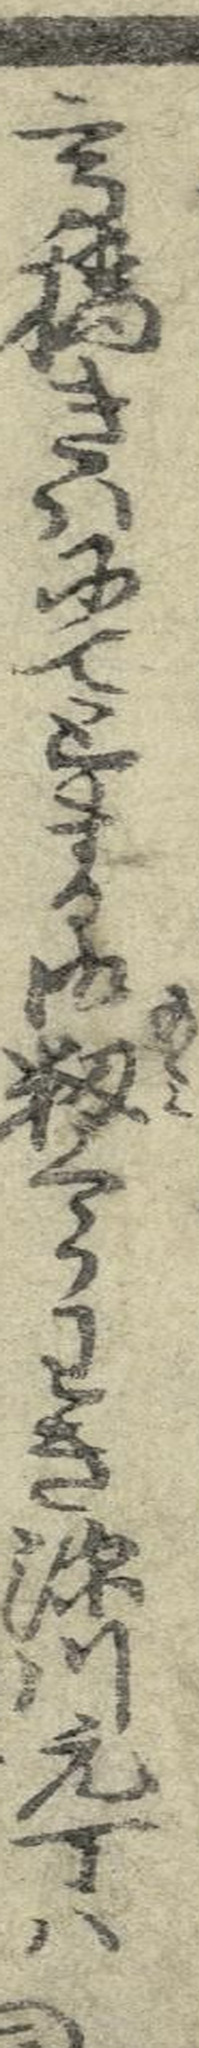高橋きハにてとまる御籾くらわき深川元丁ハ
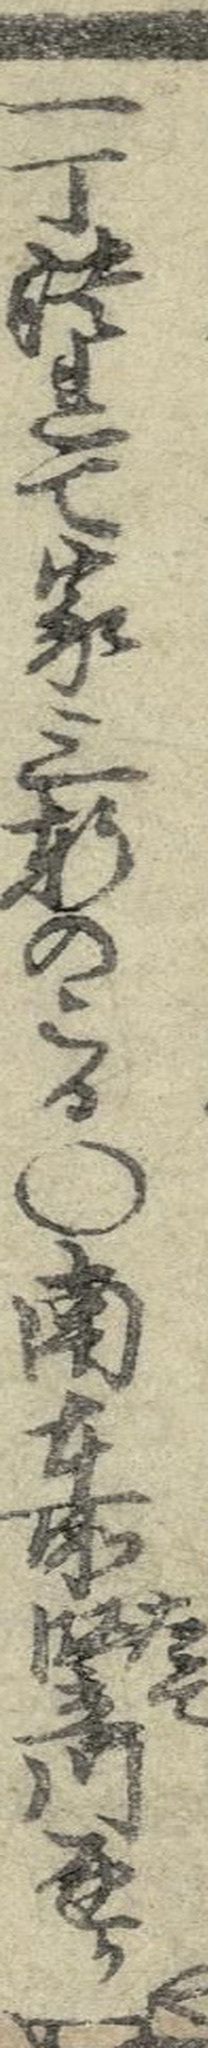一丁潰れて家三軒のこる○南本所竪川通り
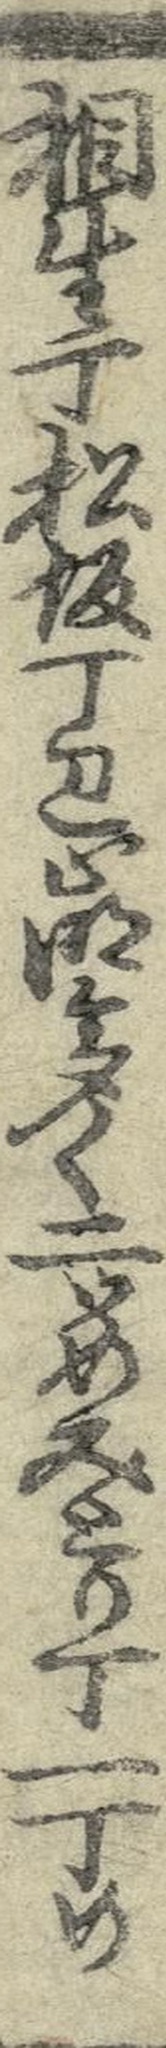相生丁松坂丁辺崩多く二ツめみとり丁一丁め
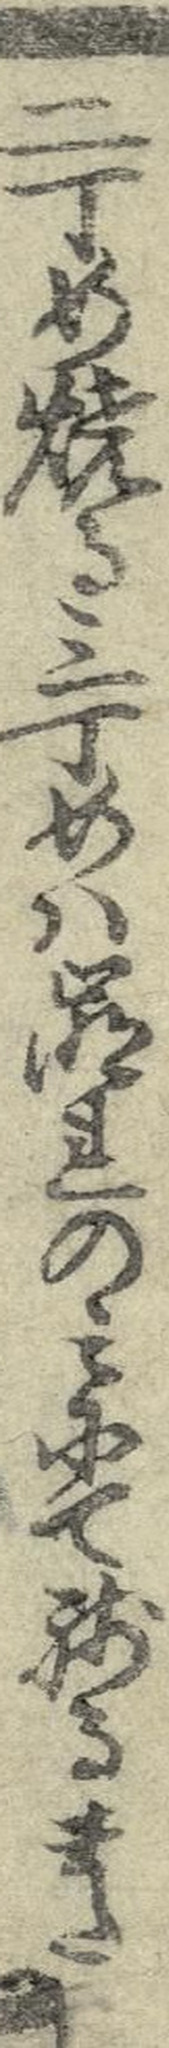二丁め焼る三丁めハ崩れのみにて残るきた
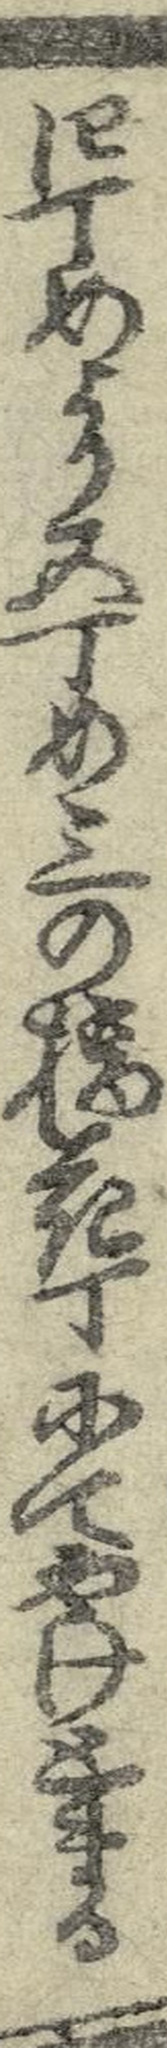四丁めより五丁め三の橋花丁少しやけとまる
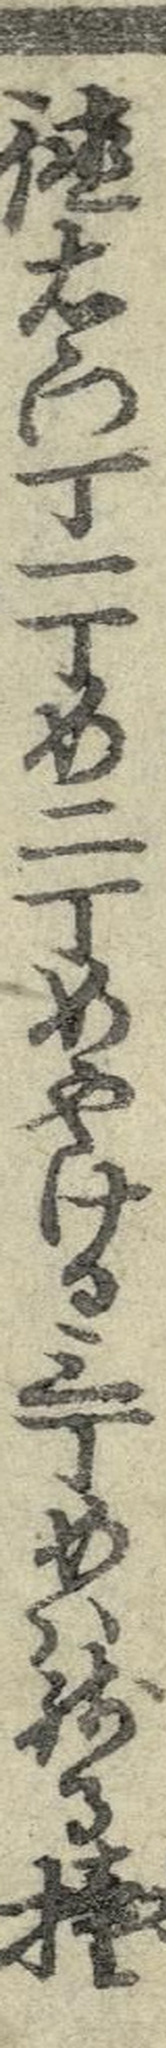徳右衛門丁一丁め二丁めやける三丁めハ残る橦
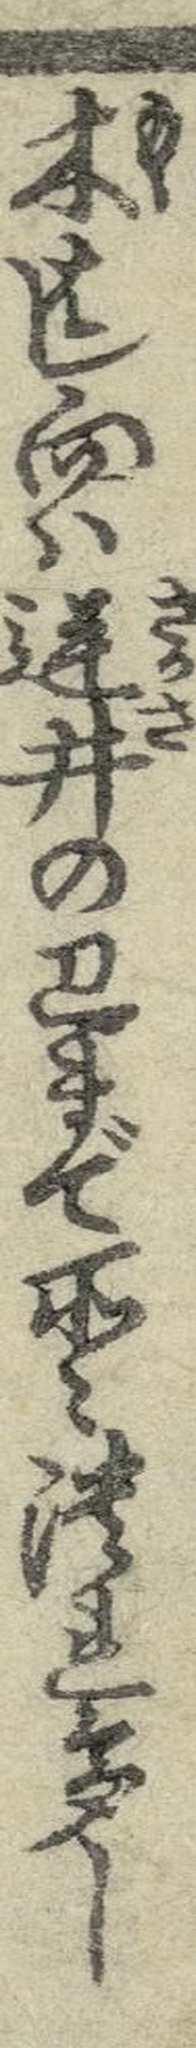木はし向ハ逆井の辺まで所々潰れ多し
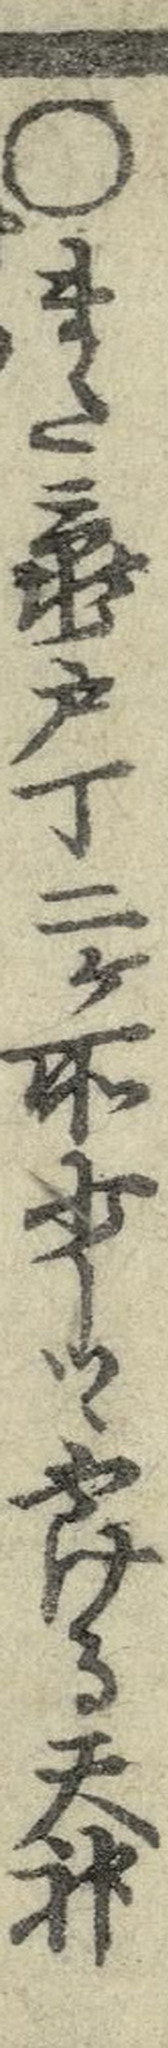○また亀戸丁二ヶ所少しツヽやける天神
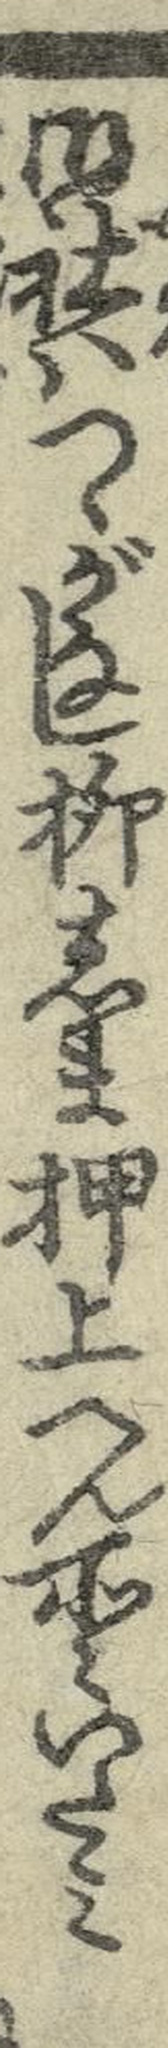御社ハつゝがなし柳しま押上へん所々いたみ
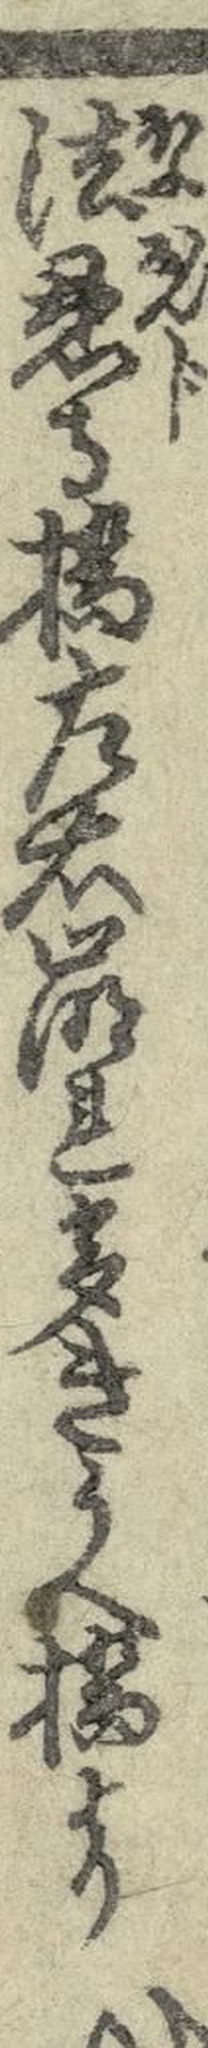法恩寺橋左右崩れ多きうへ橋より
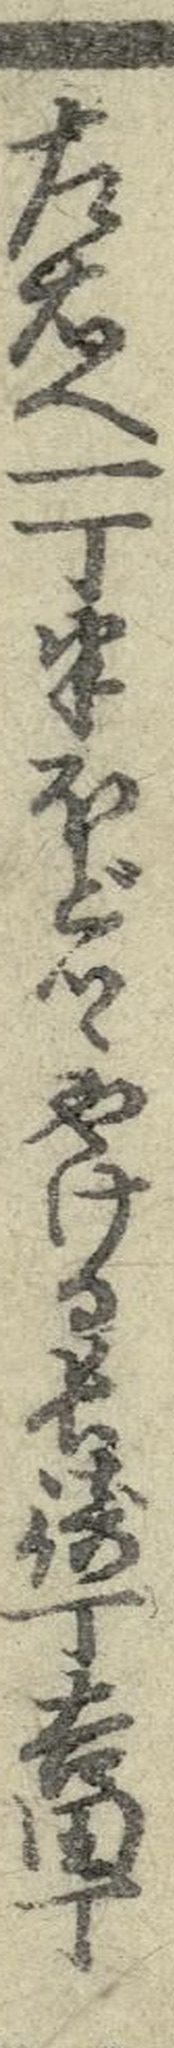左右へ一丁半ほどつゝやける長崎丁吉田丁
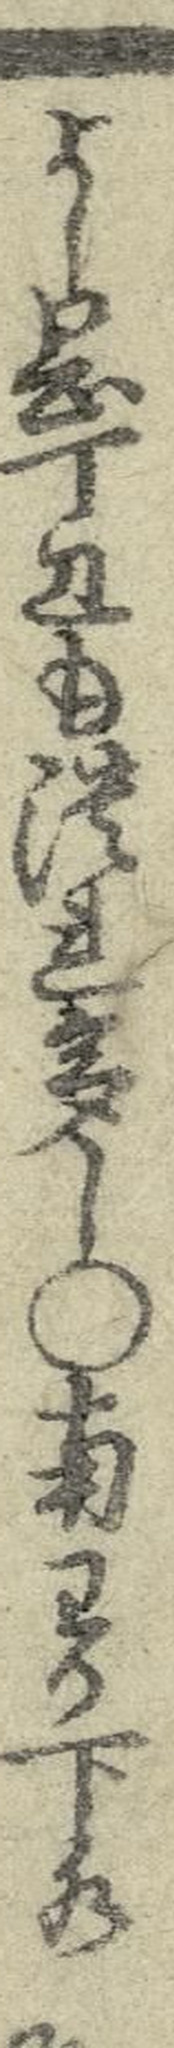よし岡丁辺も潰れ多し○南わり下水
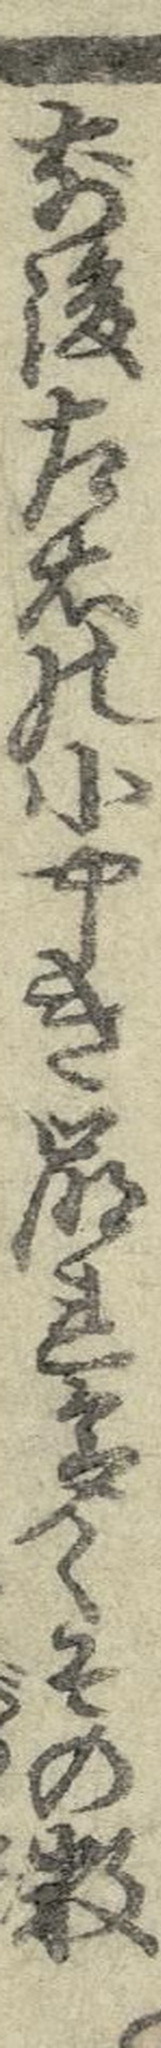前後左右の小やしき崩れ多くその数
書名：地震並出火細見記
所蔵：東京大学地震研究所図書室 Earthquake Research Institute Library, The University of Tokyo, JAPAN
